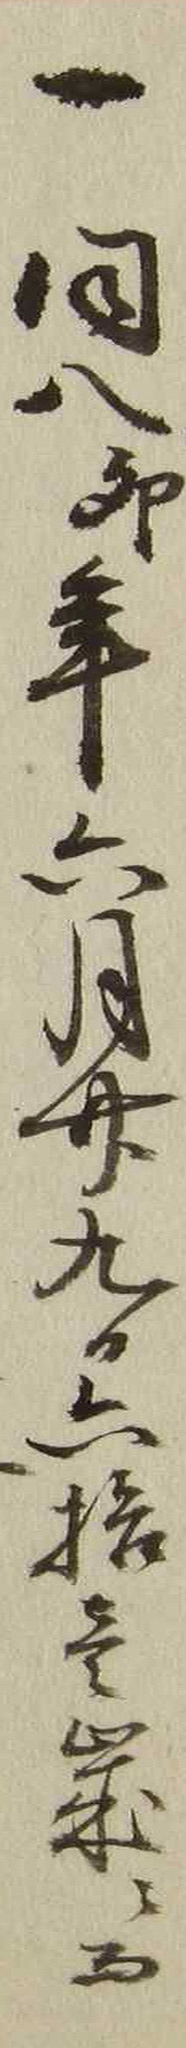一同八卯年六月廿九日六拾壱歳ニ而
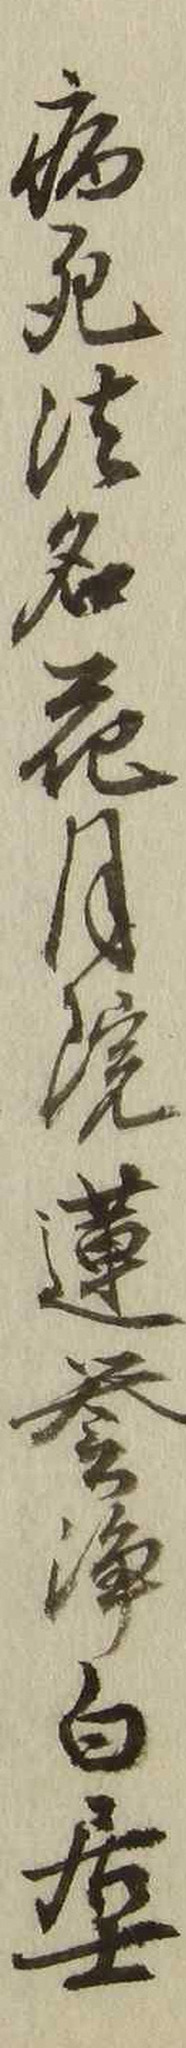病死法名花月院蓮誉浄白居士
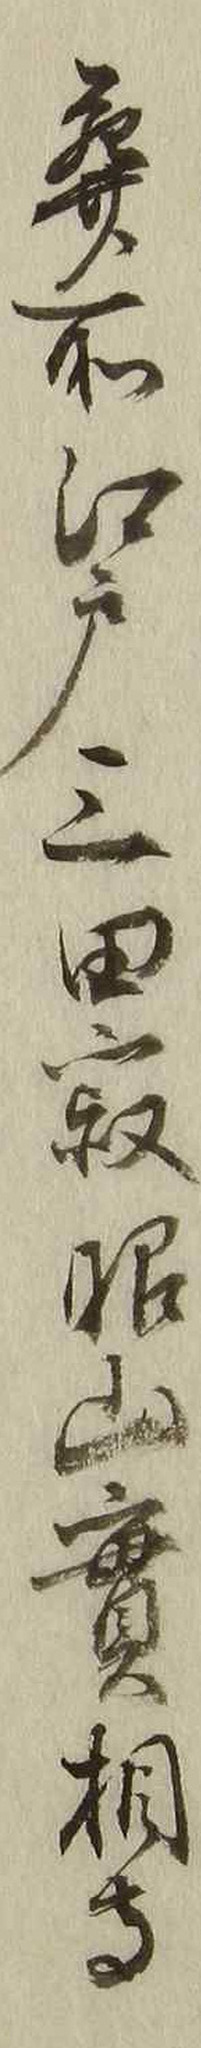葬所江戸三田寂招山実相寺
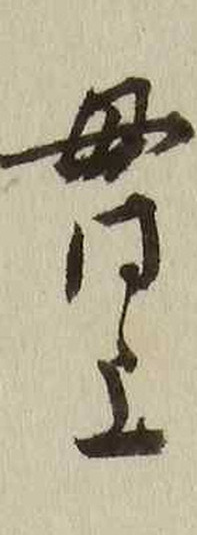母同上
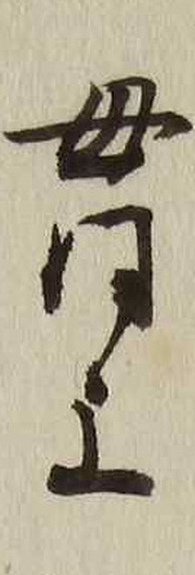母同上
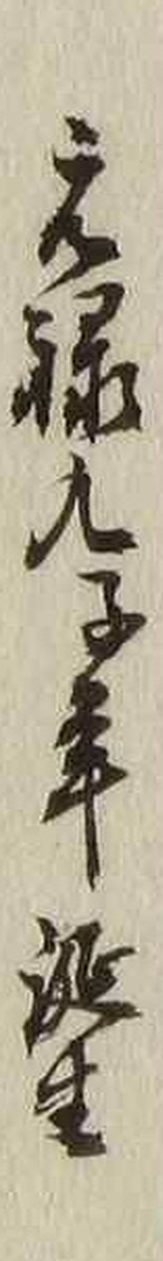元禄九子年誕生
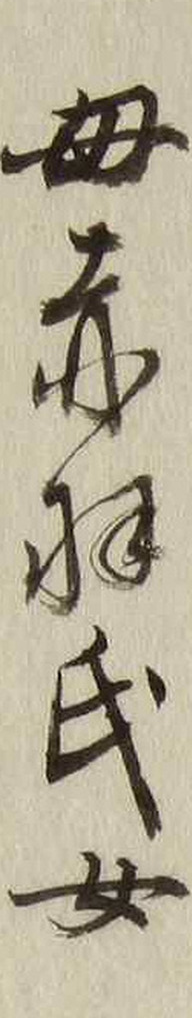母赤羽氏女
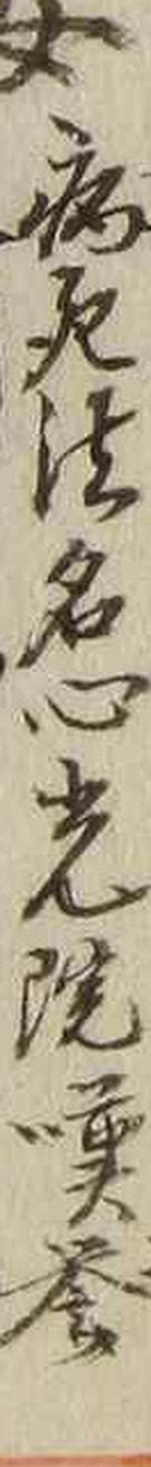病死法名心光院嘆誉
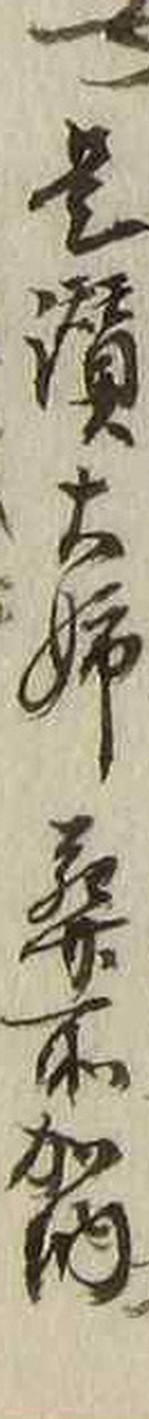是讃大姉葬所加納
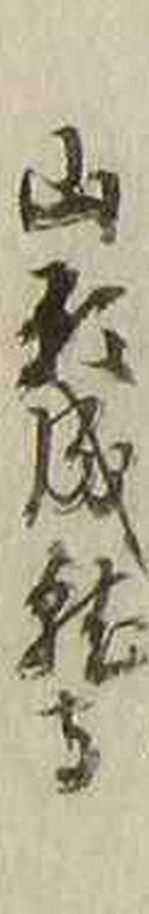山願成就寺

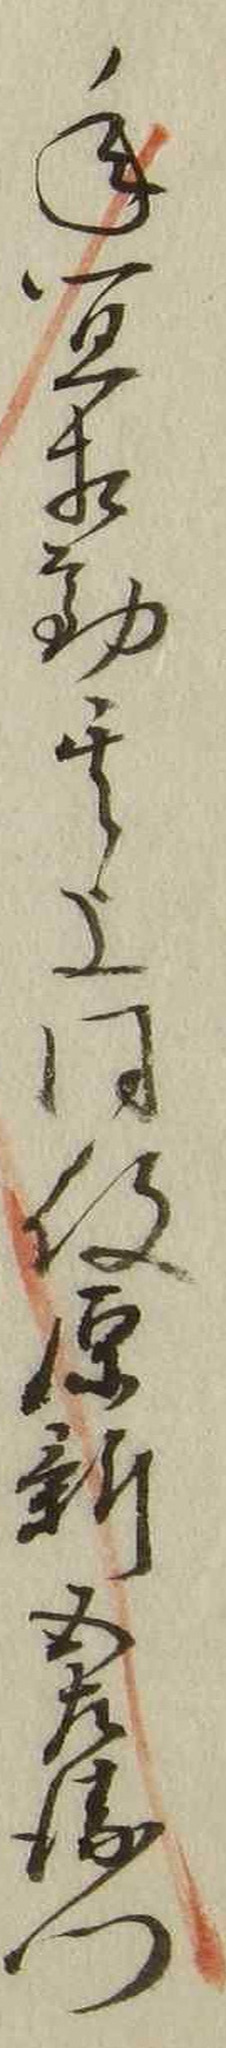年宜相勤其上同役原新五左衛門
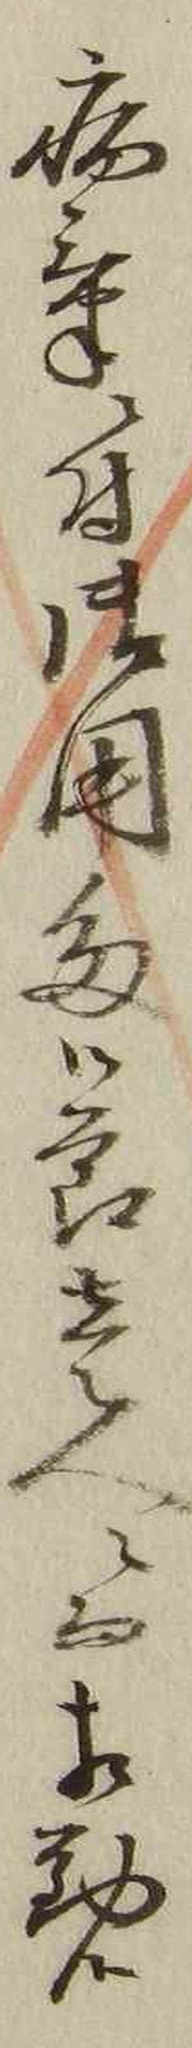病気ニ付御用多候節壱人ニ而相勤候
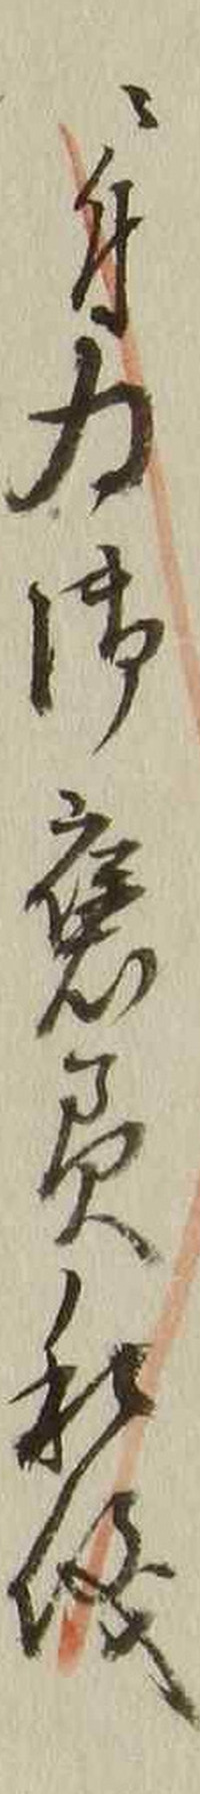ニ付為御褒美私儀
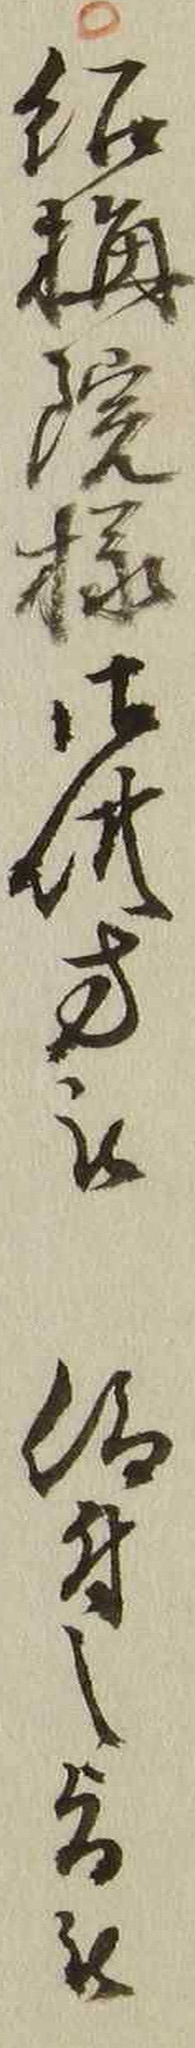◦紹栴院様御供方被仰付之旨被
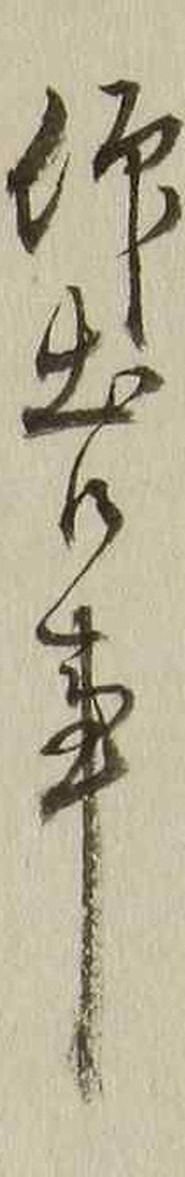仰出候事
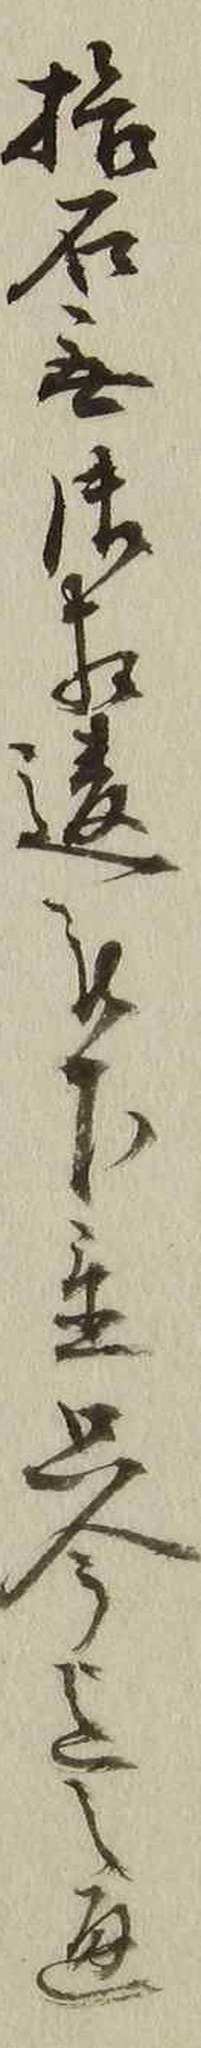拾石無御相違被下置只今迄之通
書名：諸士系譜　巻之23　い之部23
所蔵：会津若松市立会津図書館
